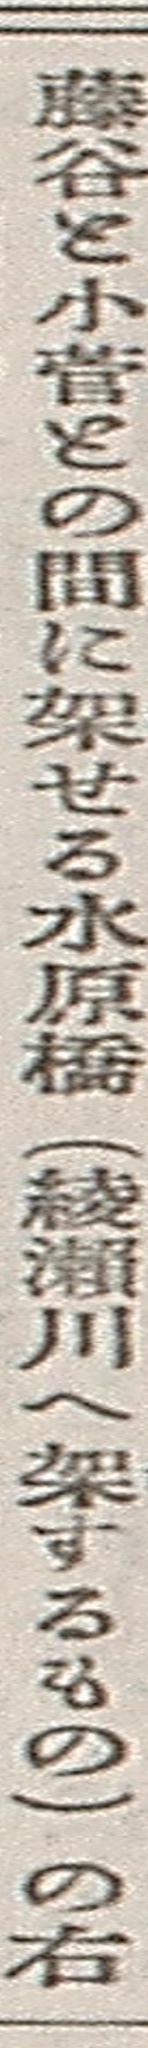藤谷と小菅との間に架せる水原橋するもの）の右
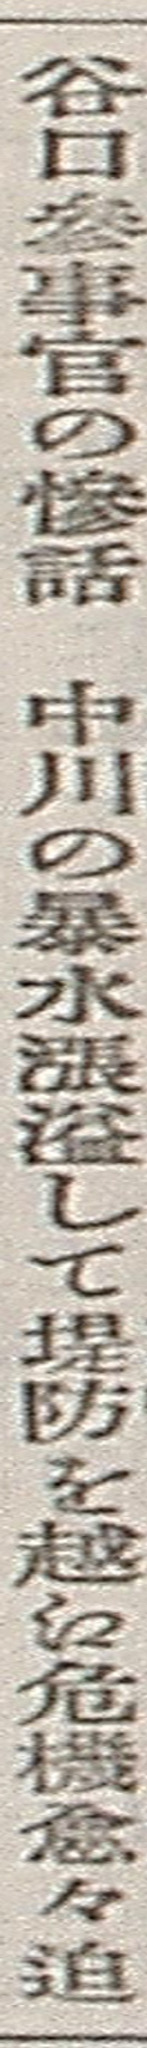谷口参事官の惨話中川の暴水漲溢して堤防を越え危機愈々迫
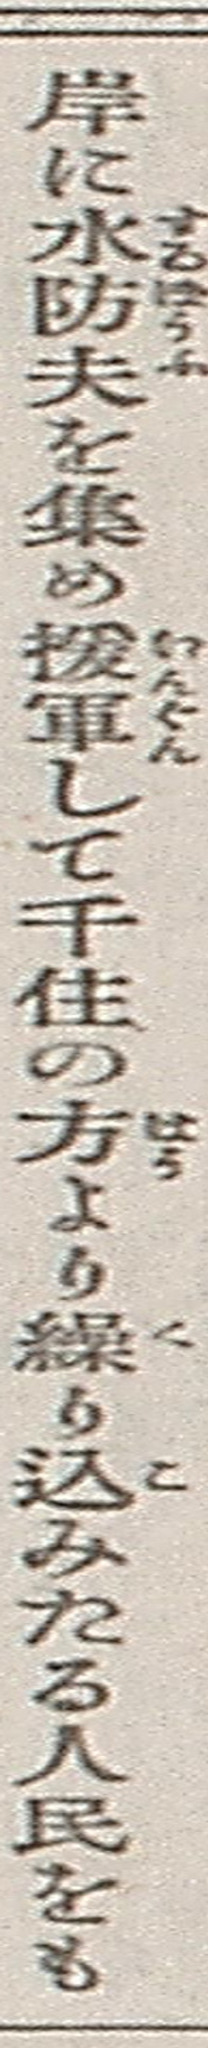岸に水防夫を集め援軍して千住の方より繰り込みたる人民をも
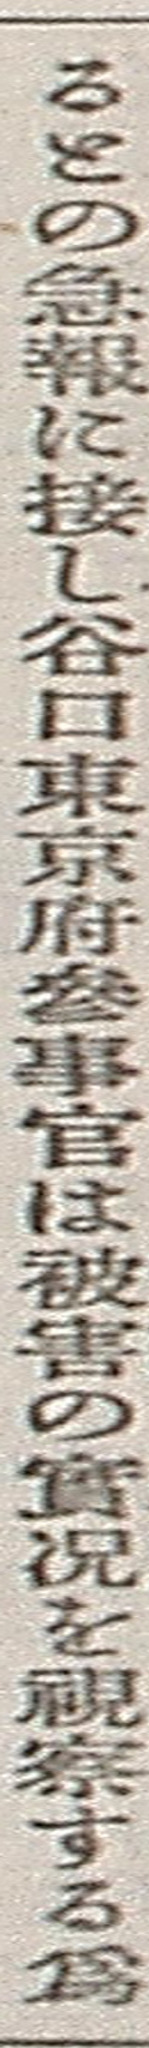るとの急報に接し谷口東京府参事官は被害の実況を視察する為
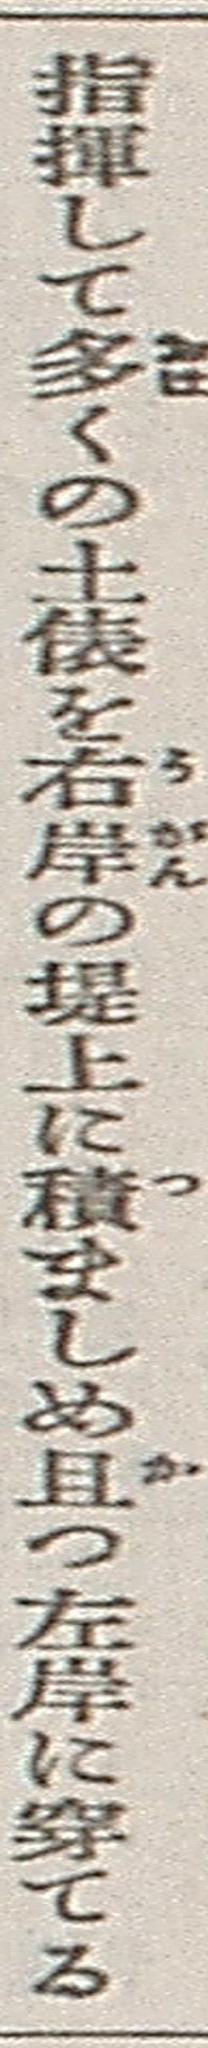指揮して多くの土俵を右岸の堤上に積ましめ且つ左岸に穿てる
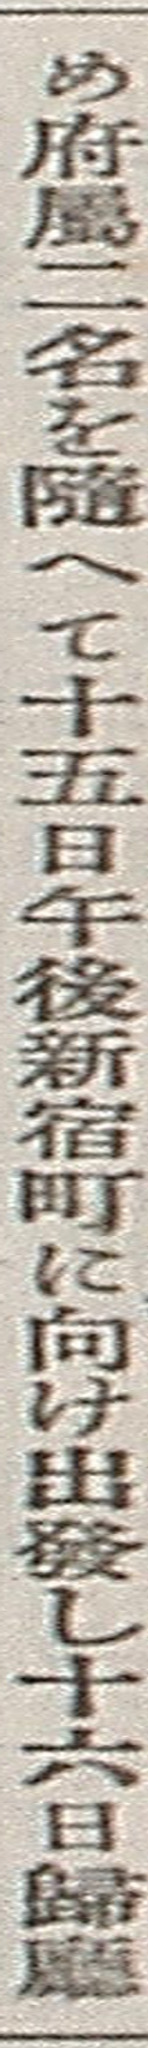め府属二名を随へて十五日午後新宿町に向け出発し十六日帰庁

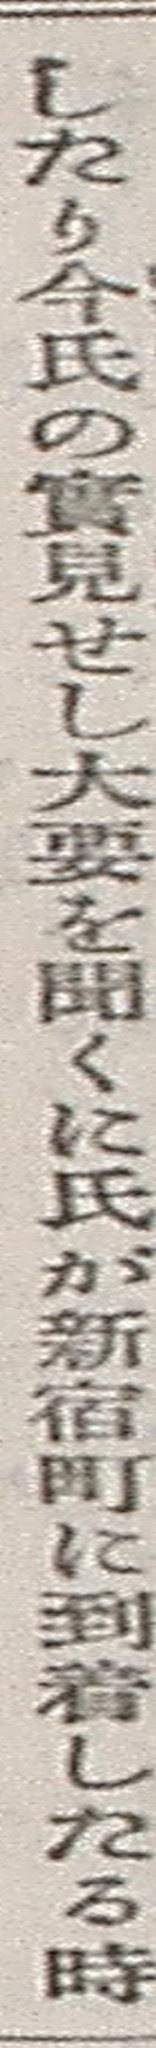したり今氏の実見せい大要を聞くに氏が新宿町に到着したる時
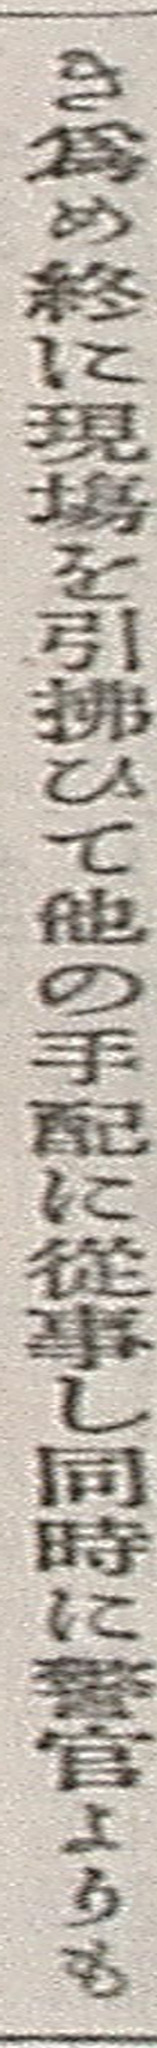き為め終に現場を引払ひて他の手配に従事し同時に警官よりも
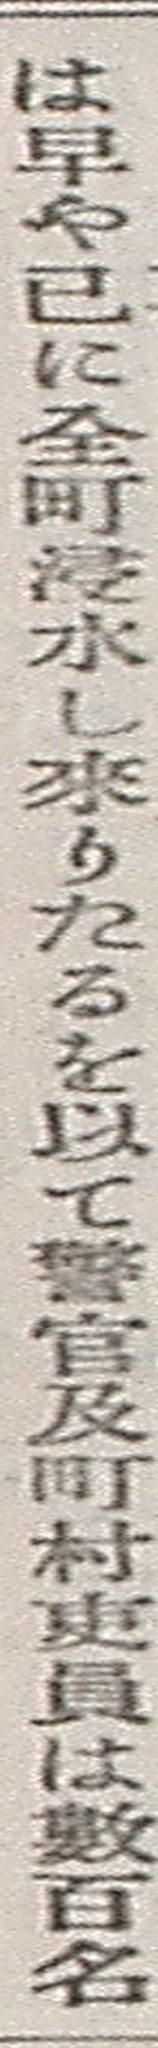は早や已に全町浸水し来りたるを以て警官及町村吏員は数百名
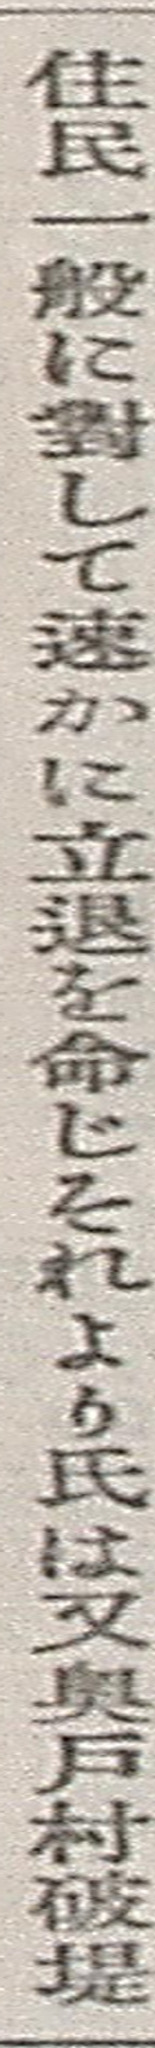住民一般に対して速かに立退を命じそれより氏は又奥戸村破堤
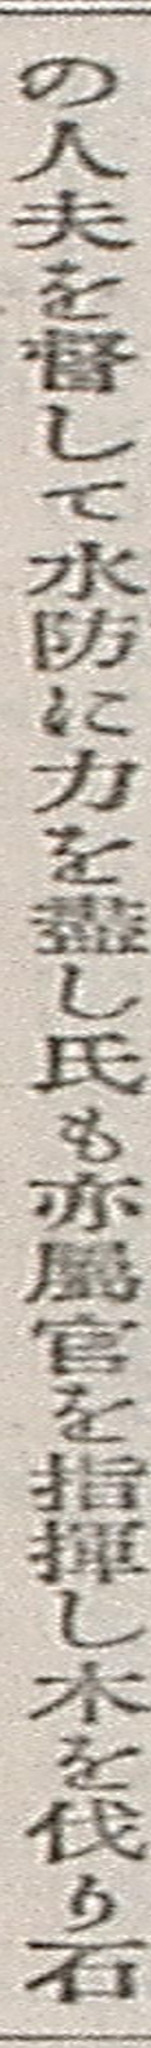の人夫を督して水防に力を尽し氏も亦属官を指揮し木を伐り石
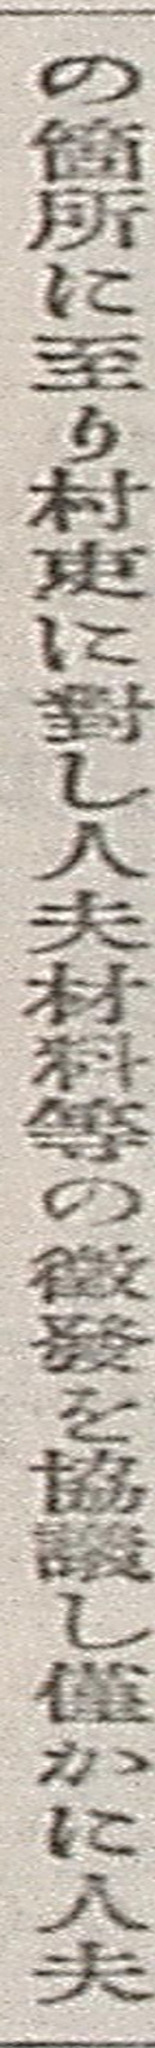の箇所に至り村吏に対し人夫材料等の徴発を協議し僅かに人夫
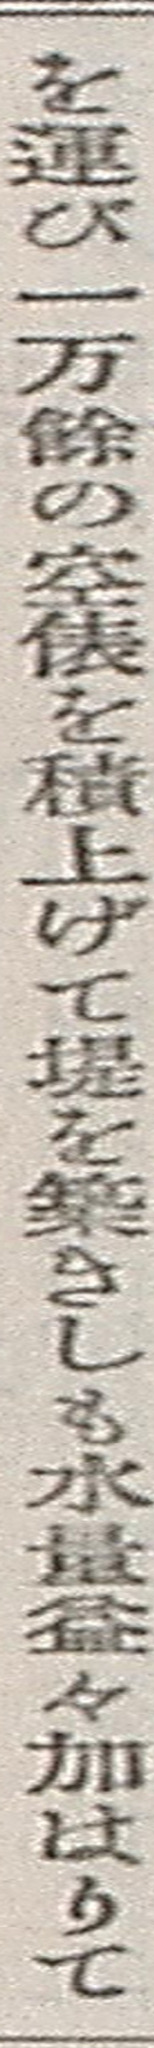を運び一万余の空俵を積上げて堤を築きしも水量益々加はりて
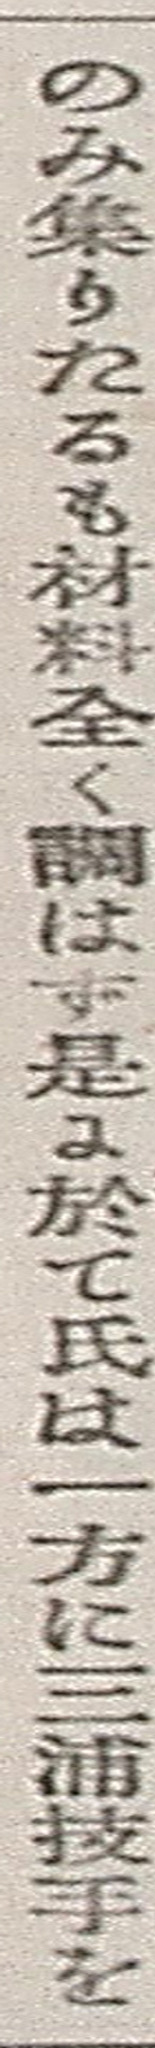のみ集りたるも材料全く調はず是に於て氏は一方に三浦技手を
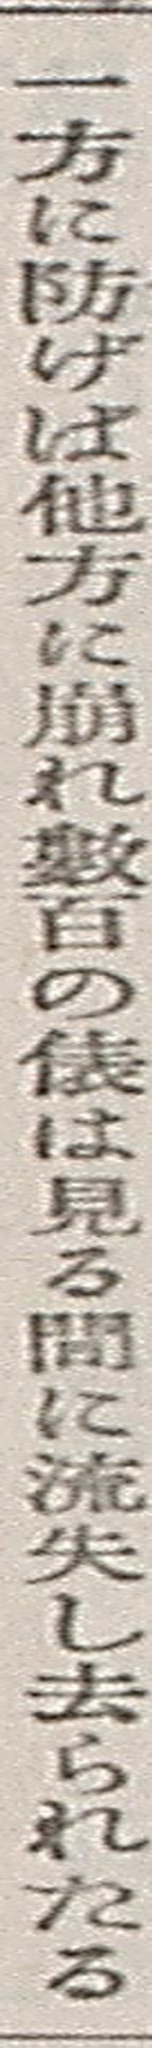一方に防げば他方に崩れ数百の俵は見る間に流失し去られたる
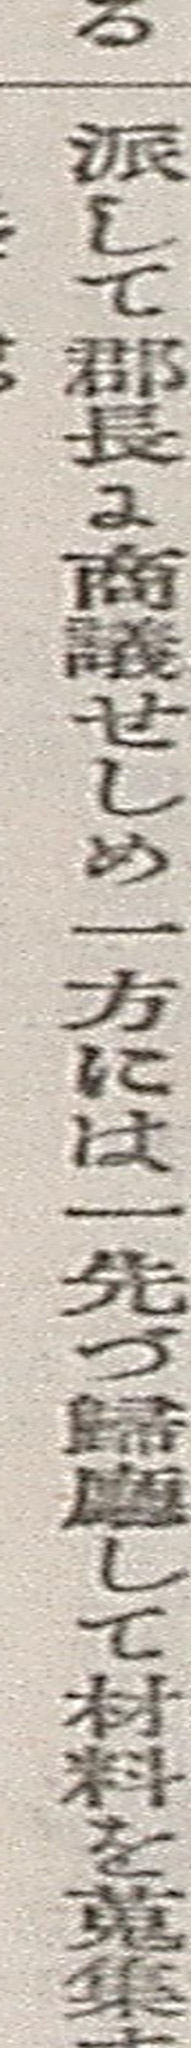派して郡長に商議せしめ一方には一先づ帰庁して材料を蒐集す
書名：風俗畫報臨時増刊第百二十四號　洪水地震被害録（上）
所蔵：東京大学地震研究所図書室 Earthquake Research Institute Library, The University of Tokyo, JAPAN
